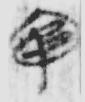竆（躬）
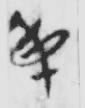身
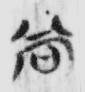尚
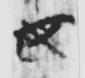母
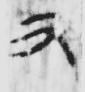又（有）
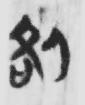咎
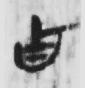占
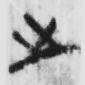之
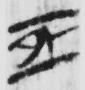亙（恆）
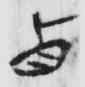貞
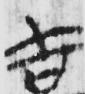吉
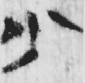少
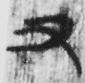又（有）
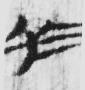於
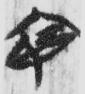竆（躬）
